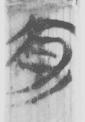宜
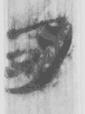明
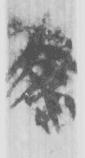家
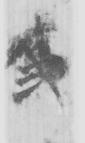及
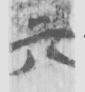亓
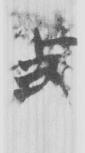攴
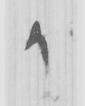人
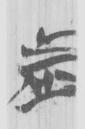者
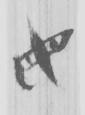母
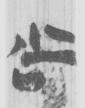{少口}
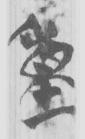重
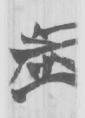者
